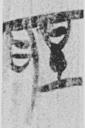聖（聼）
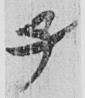子
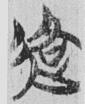路
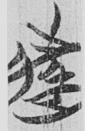往
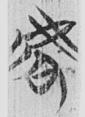唬（乎）
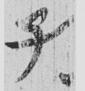子
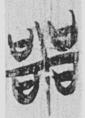噩（愕）
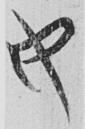女（如）
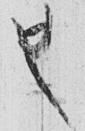也
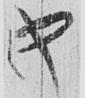女（如）
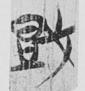○（誅）
